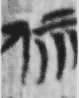𫵖
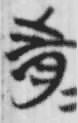之月
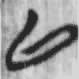㠯（以）
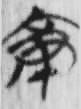○（就）
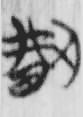荊（荆）
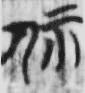𫵖
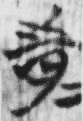之月
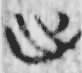出
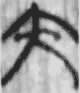內（入）
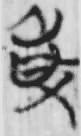事
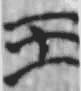王
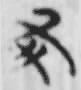○（盡）
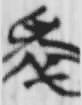○（卒）
